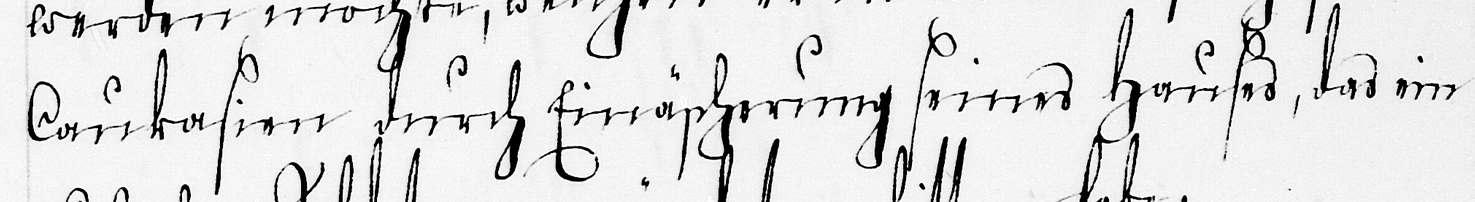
Caukasien durch Einäscherung seines Hauses, das ein
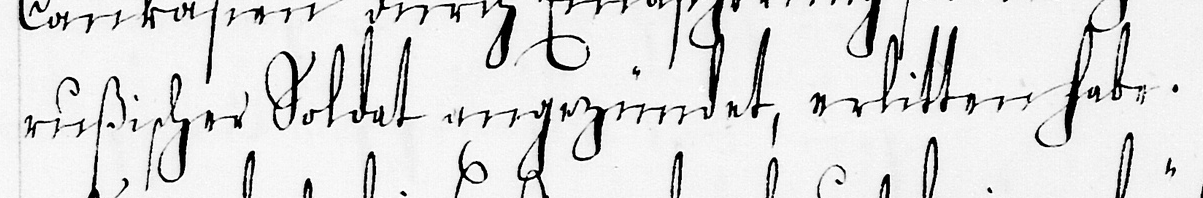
rußischer Soldat angezündet, erlitten habe.
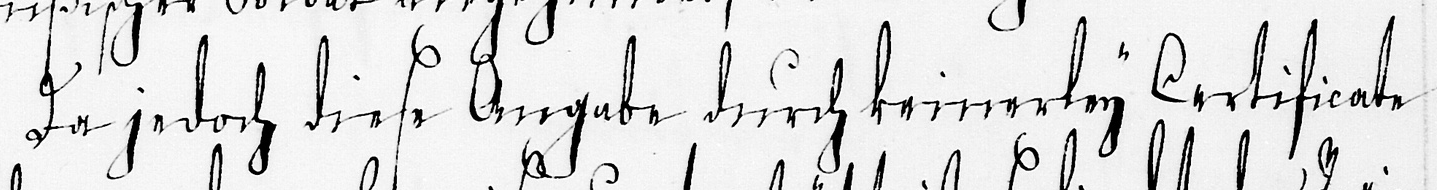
Da jedoch diese Angabe durch keinerley Certificate
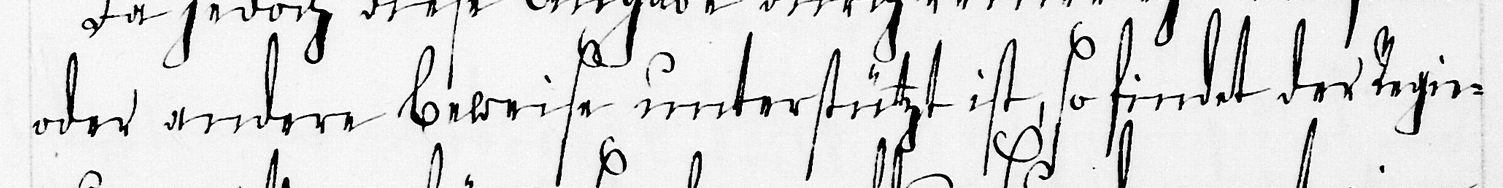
oder andere Beweise unterstützt ist, so findet der Regie¬
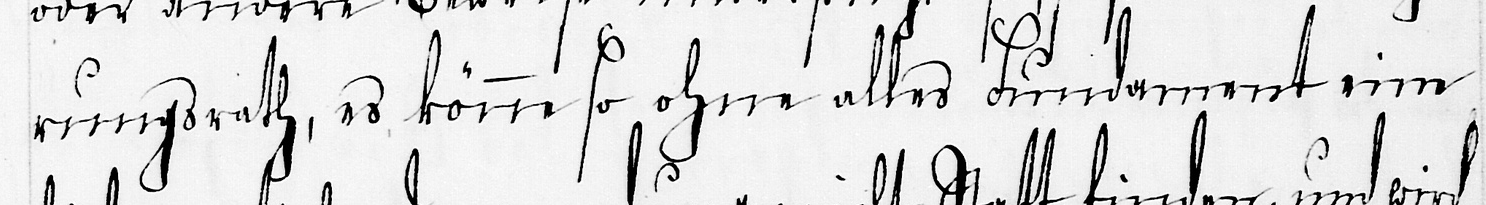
rungsrath, es könne so ohne alles Fundament eine
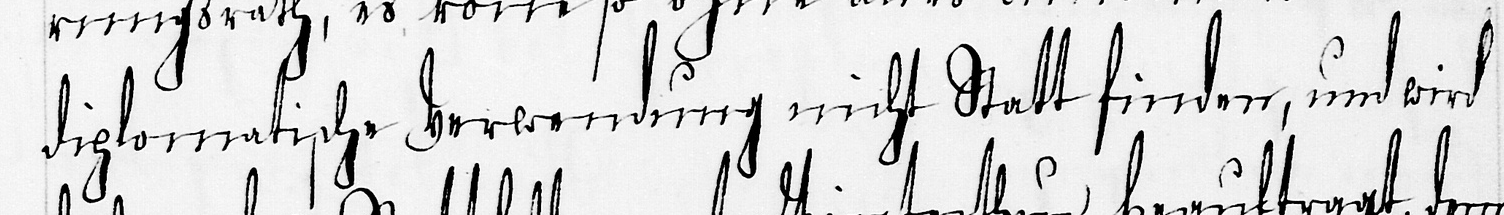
diplomatische Verwendung nicht Statt finden, und wird
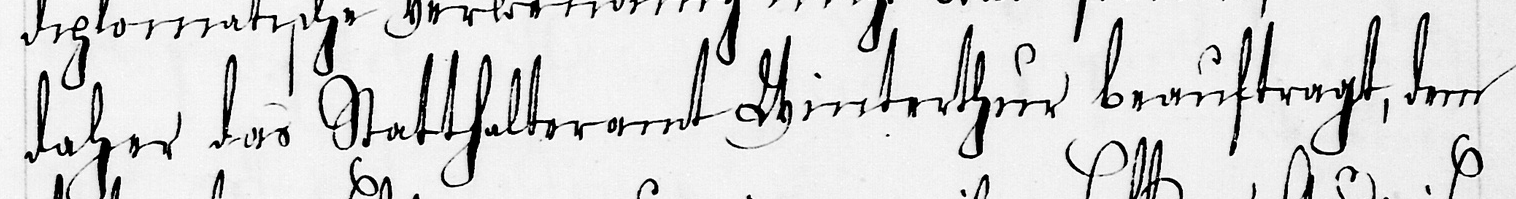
daher das Statthalteramt Winterthur beauftragt, dem
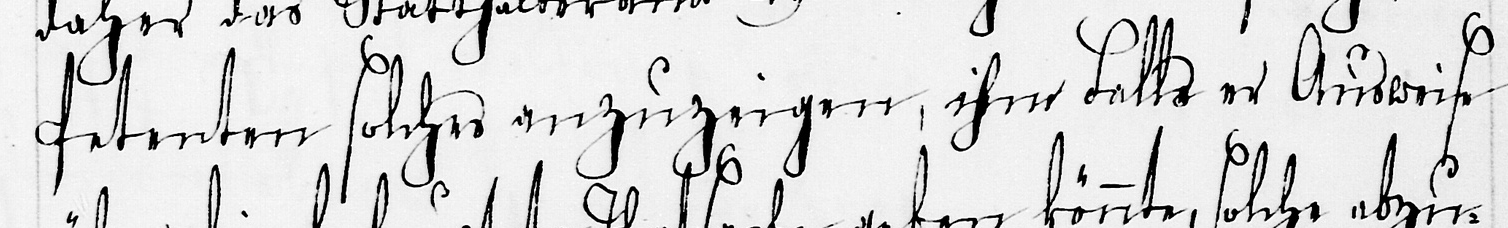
Petenten solches anzuzeigen, ihm Falls er Ausweise
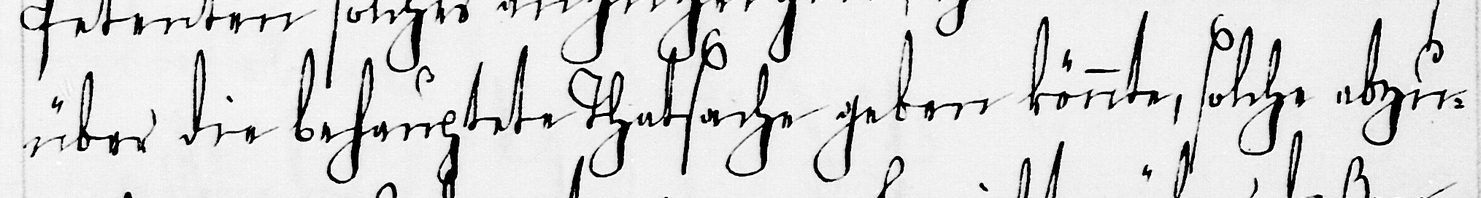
über die behauptete Thatsache geben könnte, solche abzu¬
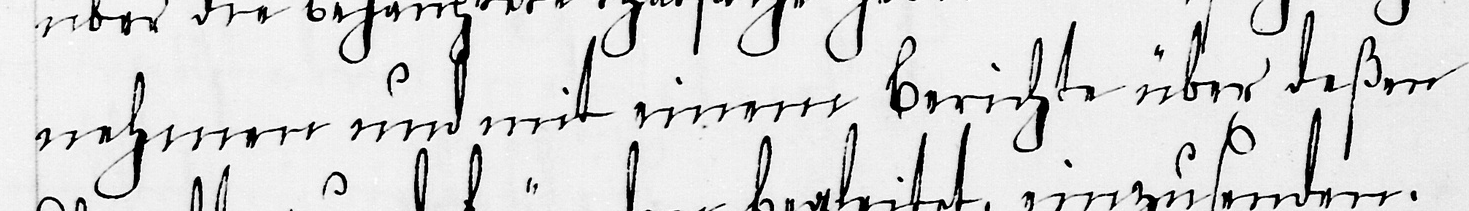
nehmen und mit einem Berichte über deßen
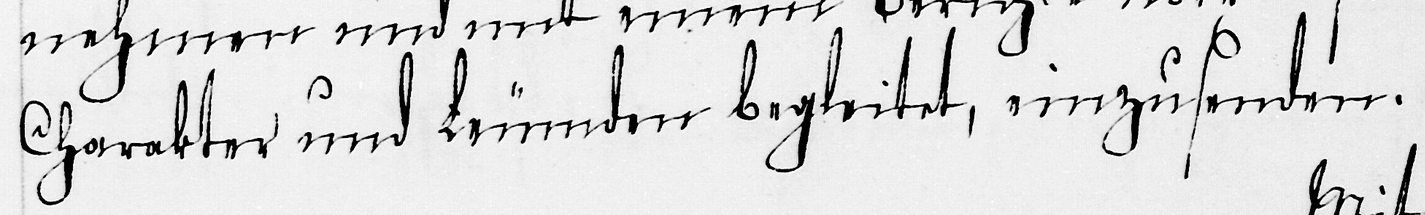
Charakter und Leumden begleitet, einzusenden.
